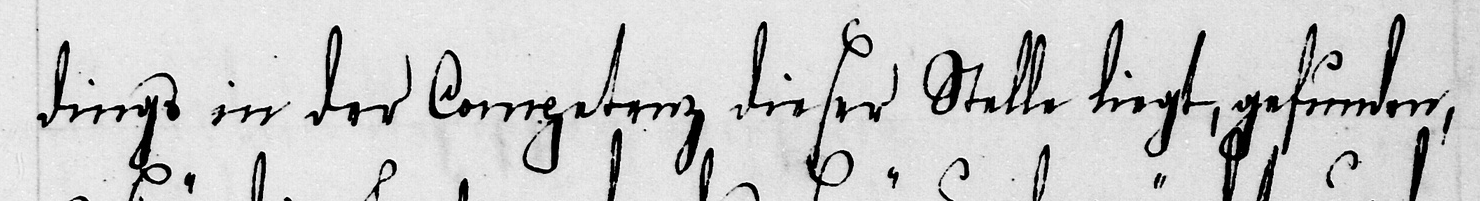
dings in der Competenz dieser Stelle liegt, gefunden,
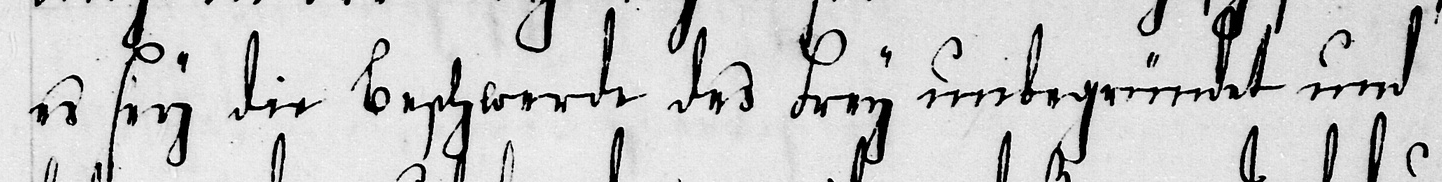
es sey die Beschwerde des Frey unbegründet und
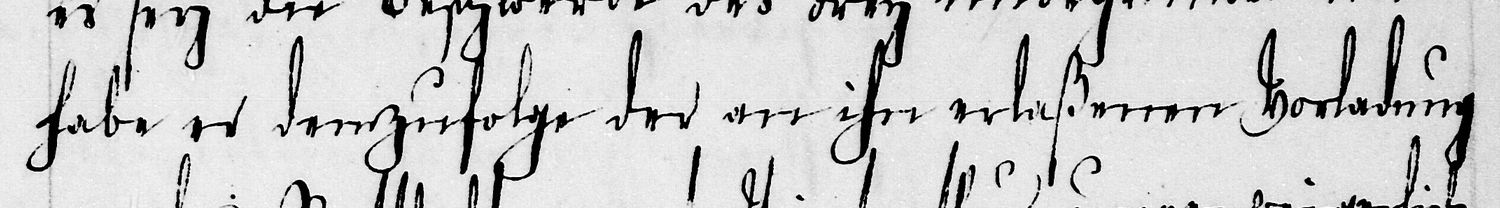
habe er demzufolge der an ihn erlaßenen Vorladung
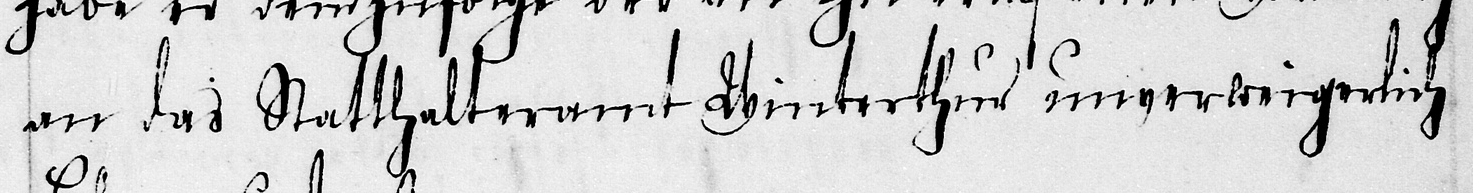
an das Statthalteramt Winterthur unverweigerlich
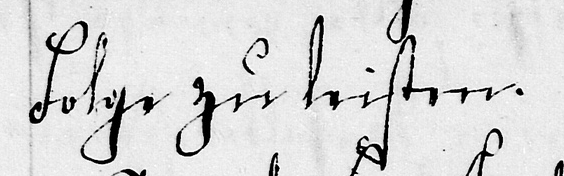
Folge zu leisten.
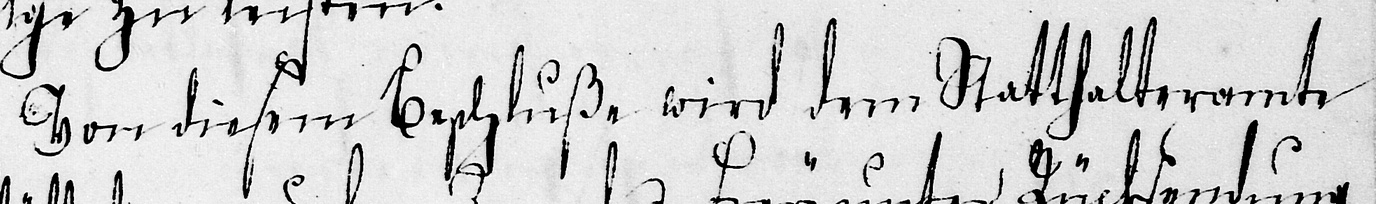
Von diesem Beschluße wird dem Statthalteramte
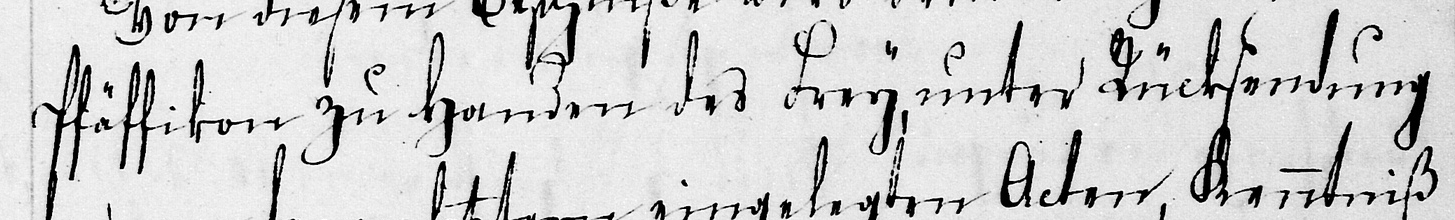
Pfäffikon zu Handen des Frey, unter Rücksendung
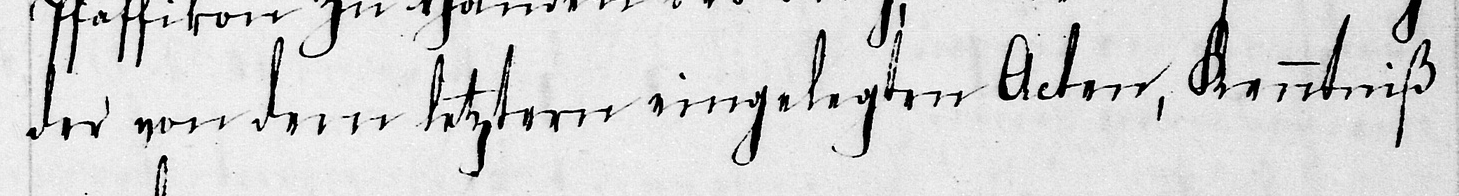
der von dem letztern eingelegten Acten, Kenntniß
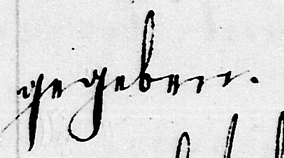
gegeben.
